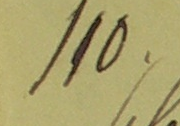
110
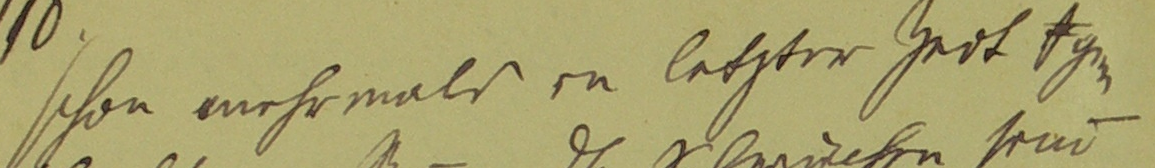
schon mehrmals in letzter Zeit mitge¬
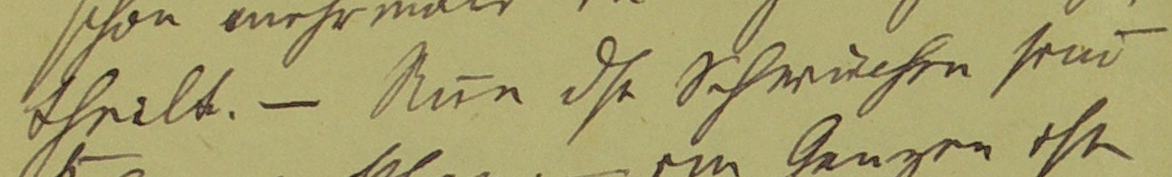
theilt. - Nur dse Schwächen sind
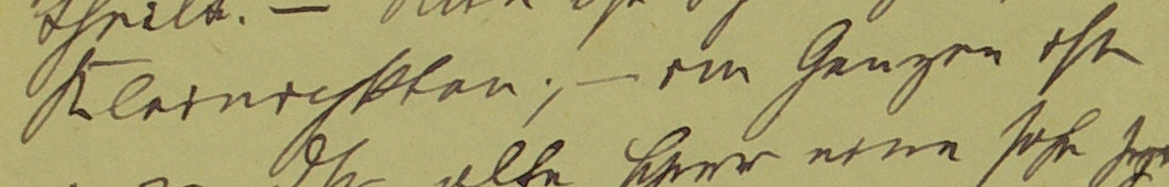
Kleinigkeiten; - im Ganzen ist
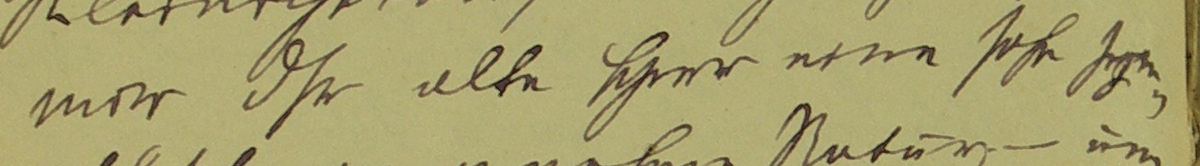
mir dsr alte Herr eine sehr sym¬
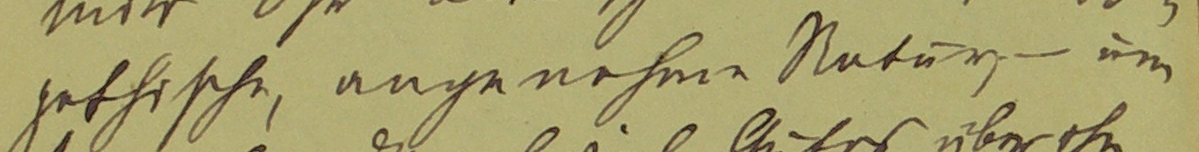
pathische, angenehme Natur, - um
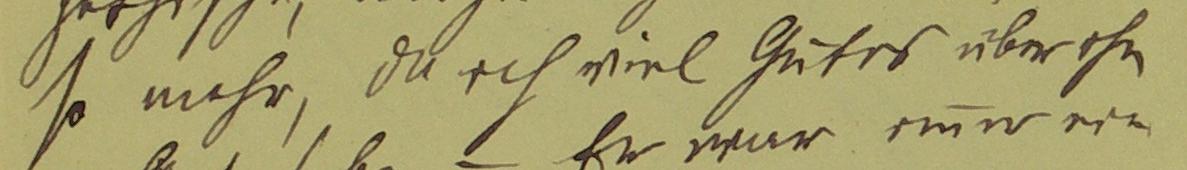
so mehr, da ich viel Gutes über ihn
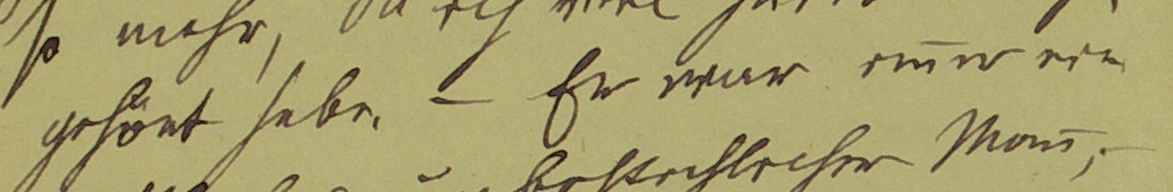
gehört habe. - Er war immer ein
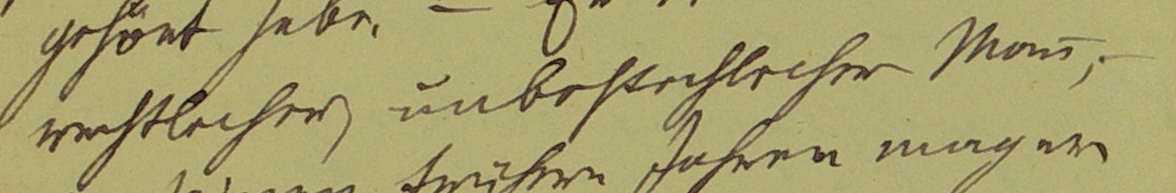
rechtlicher, unbestechlicher Mann,
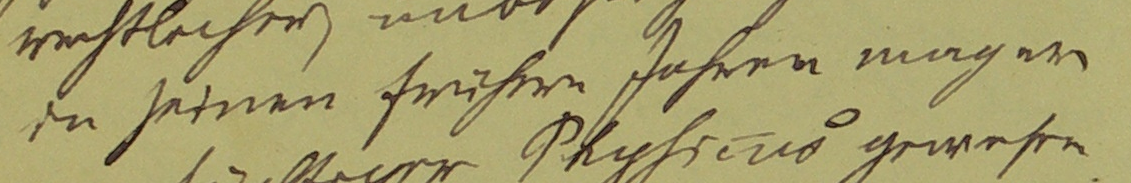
in seinen frühen Jahren mag er
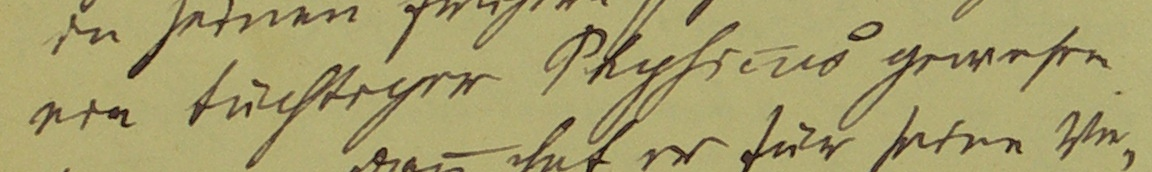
ein tüchtiger Physicus gewesen
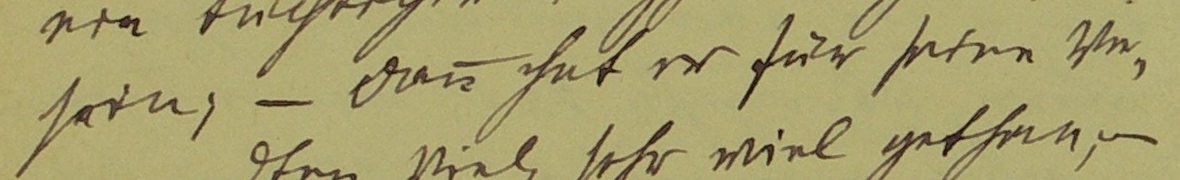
sein; - dann hat er für seine Ver¬
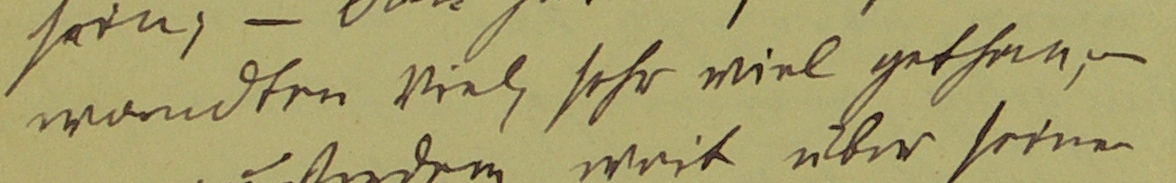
wandten viel, sehr viel gethan,-
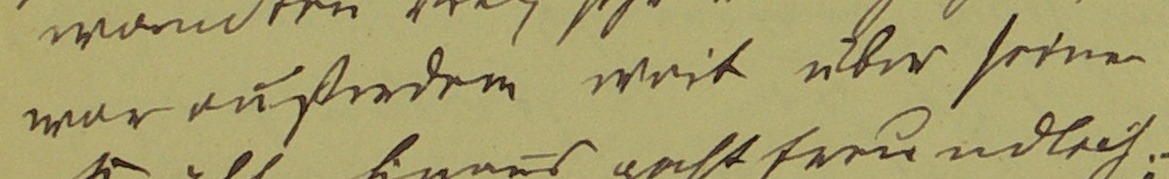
war außerdem weit über seine
